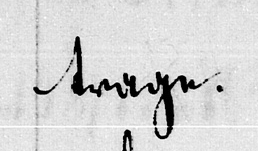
trage.
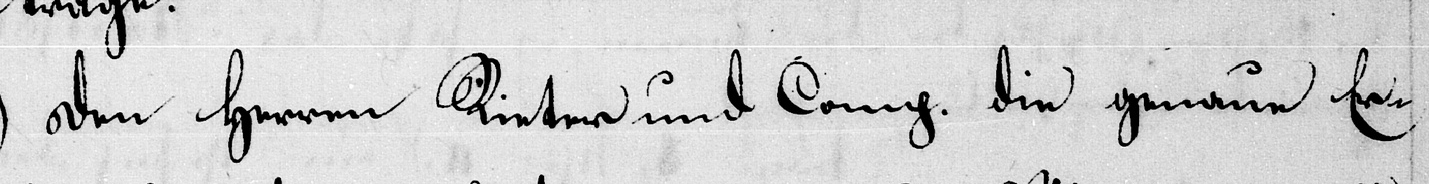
Den Herren Rieter und Comp. die genaue Er¬
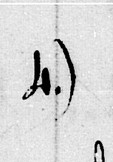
4.)
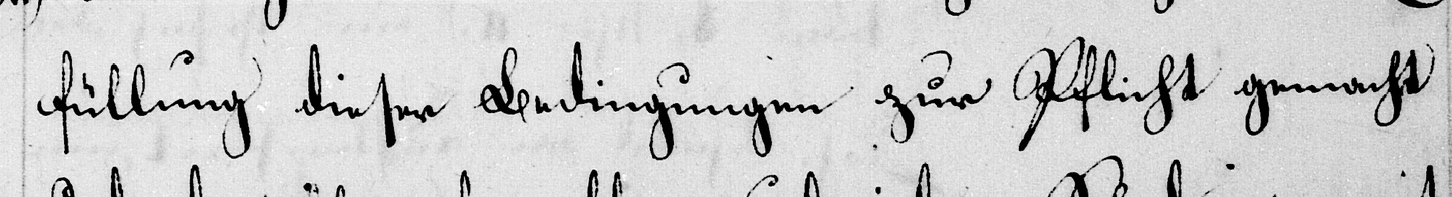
füllung dieser Bedingungen zur Pflicht gemacht
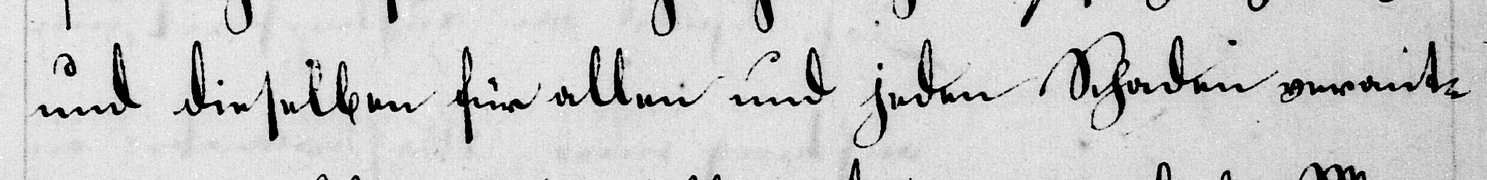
und dieselben für alle und jeden Schaden verant¬
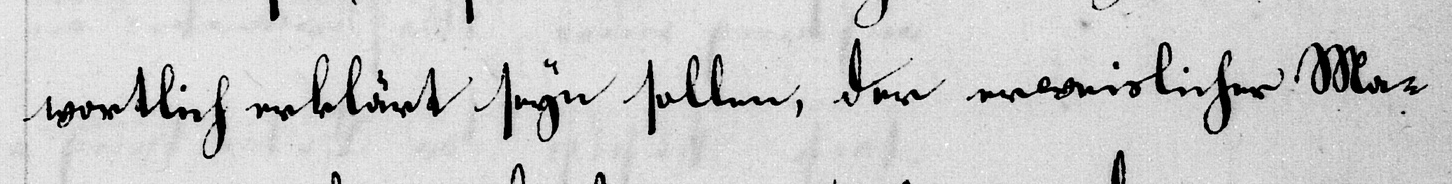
wortlich erklärt seyn sollen, der erweislicher Ma¬
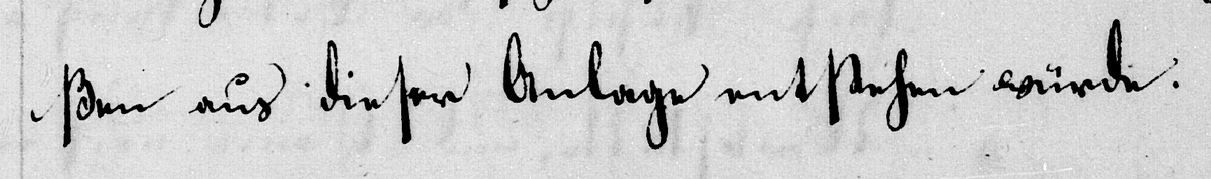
ßen aus dieser Anlage entstehen würde.
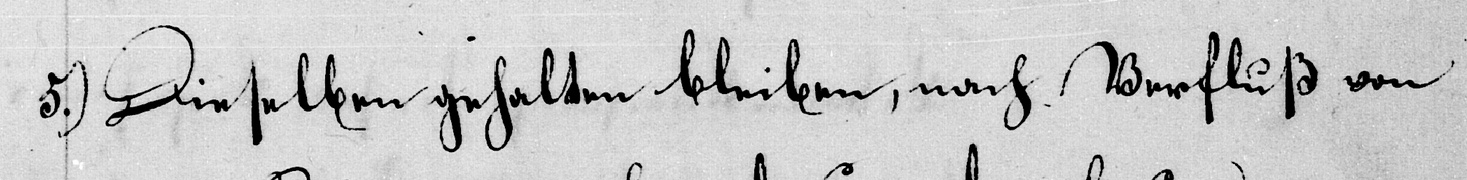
5.) Dieselben gehalten bleiben, nach Verfluß von
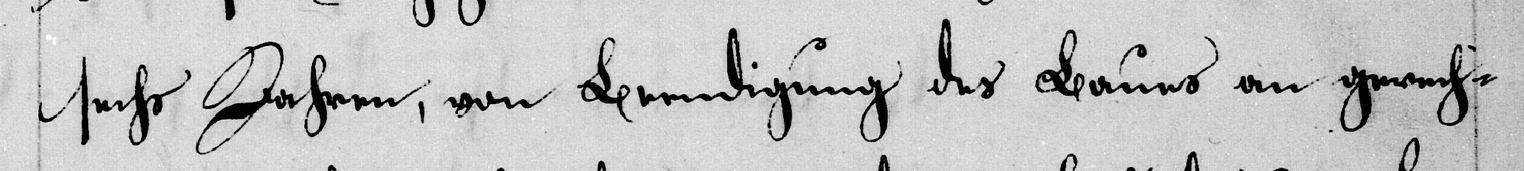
sechs Jahren, von Beendigung des Baues an gerech¬
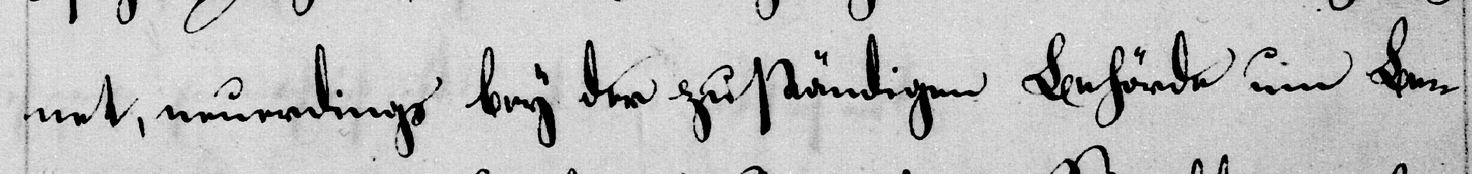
net, neuerdings bey der zuständigen Behörde um Be¬
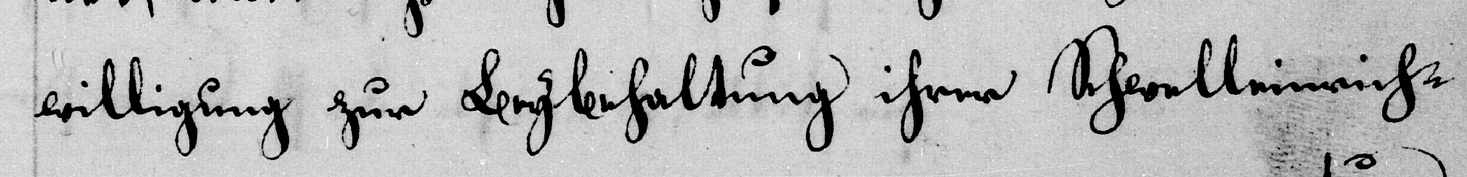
willigung zur Beybehaltung ihrer Schwelleinrich-
